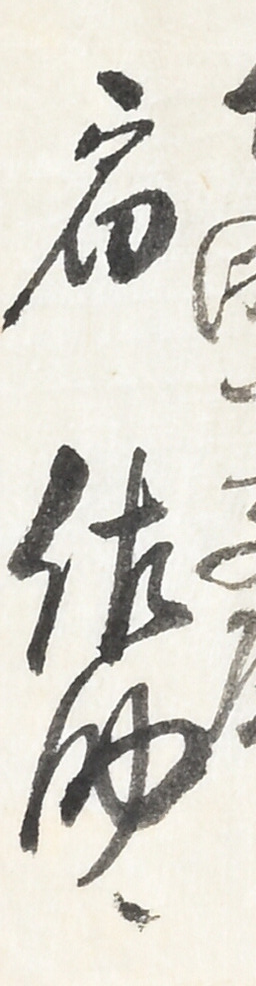宿佐助・

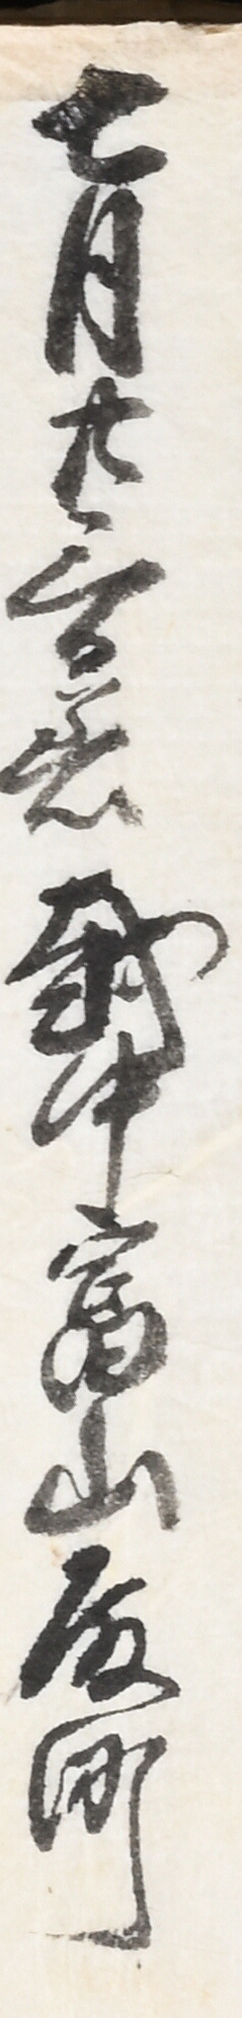七月廿三日着越中富山殿町
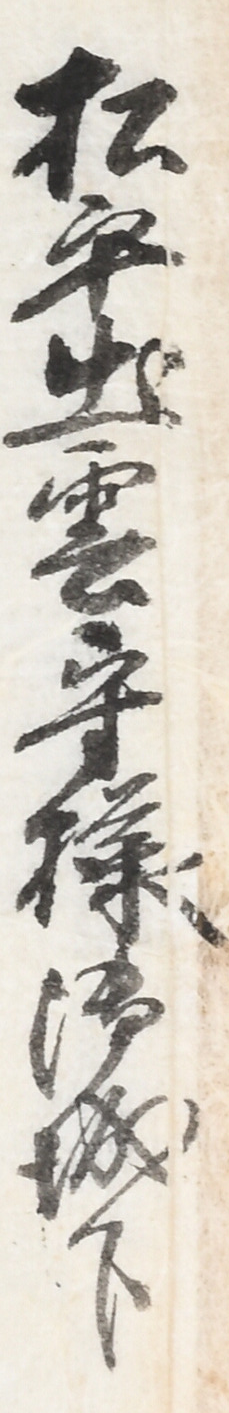松平出雲守様御城下
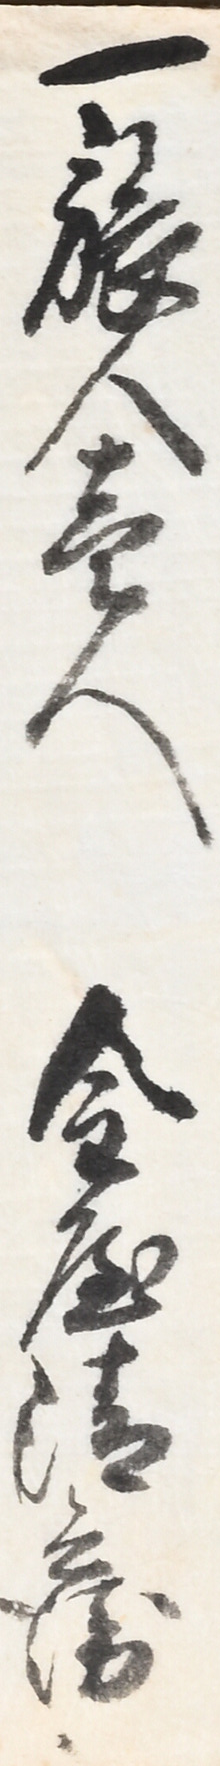一旅人壱人金屋清兵衛・
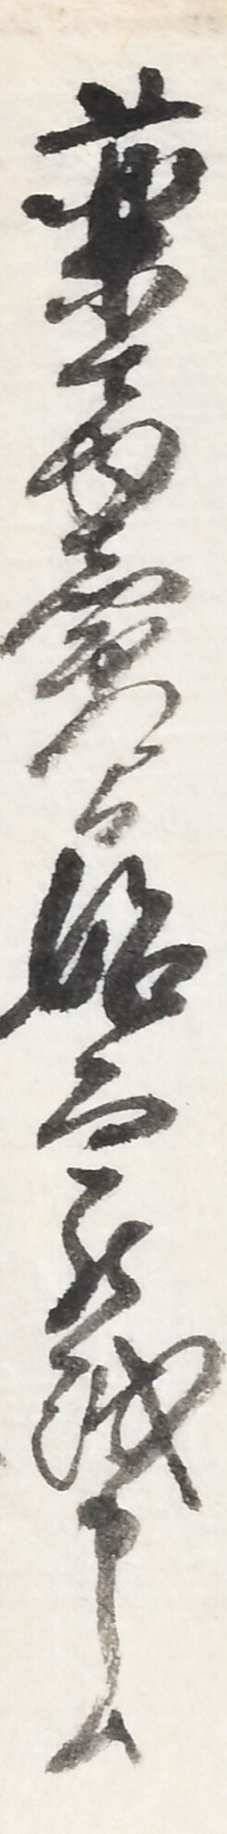薬商売ニ而始而罷越申候
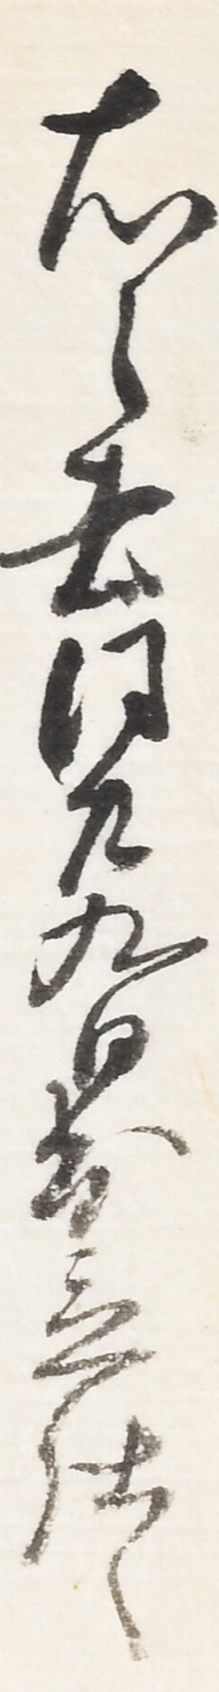右之者同廿九日出立仕候
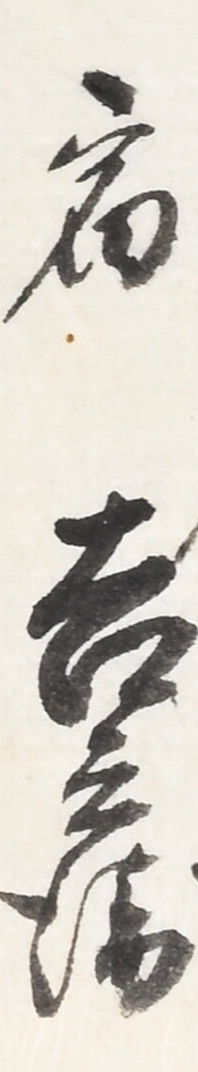宿吉兵衛
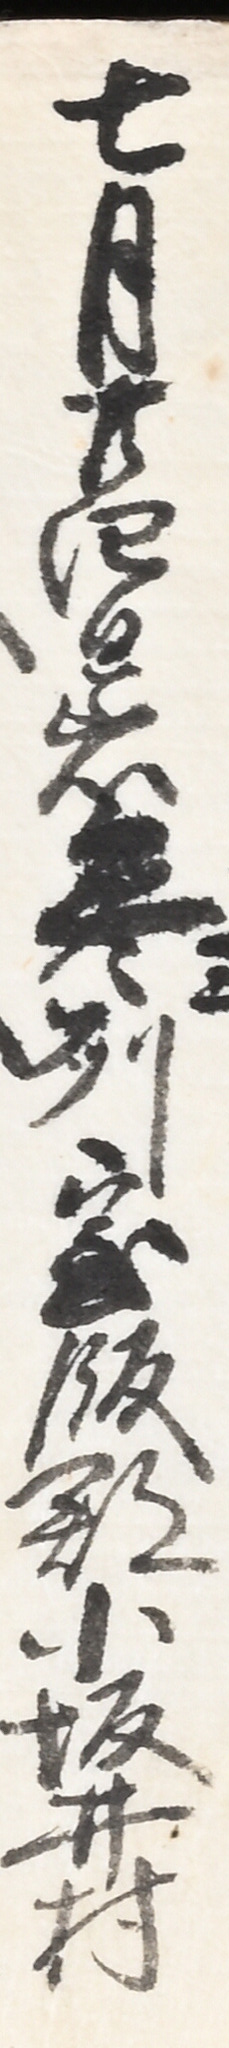七月廿四日着三三州室飯郡小坂井村
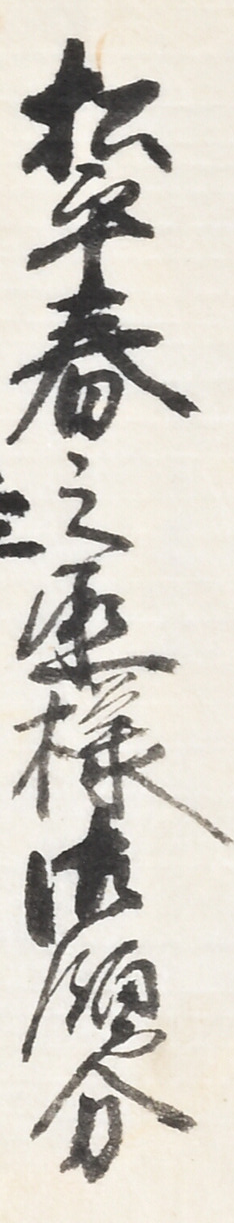松平春之丞様御領分
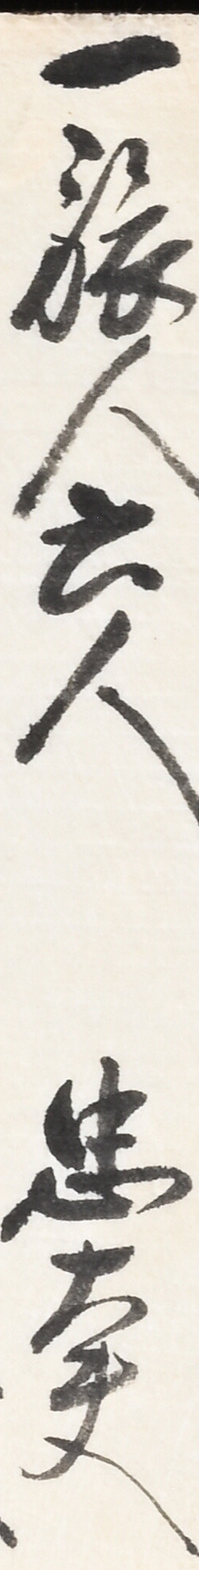一旅人六人忠大夫
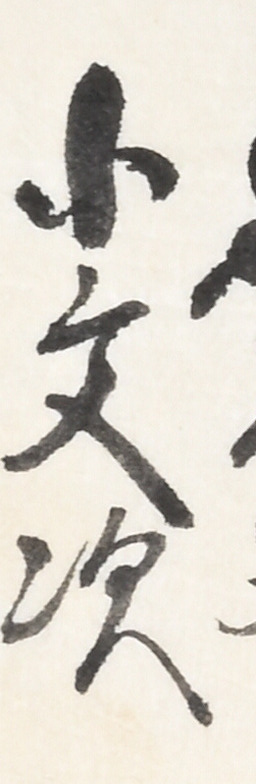小文次
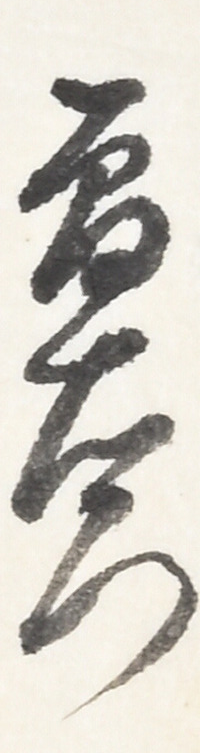曽右衛門
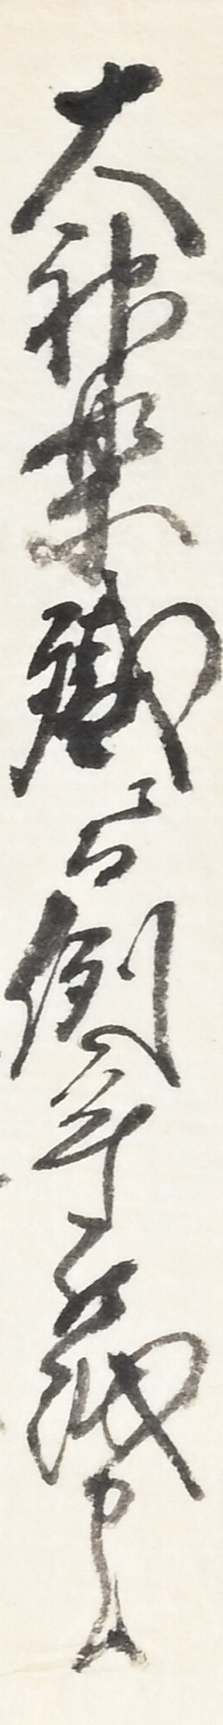大神楽職ニ而例年罷越申候
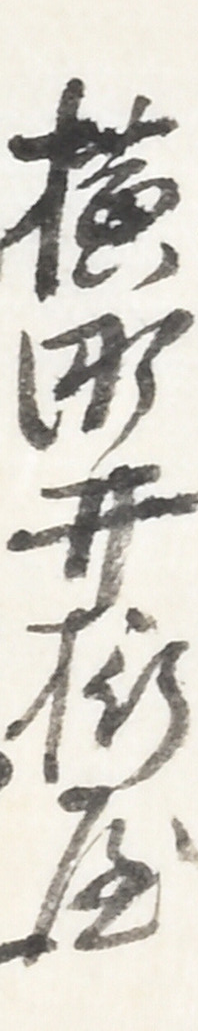横町井桁屋
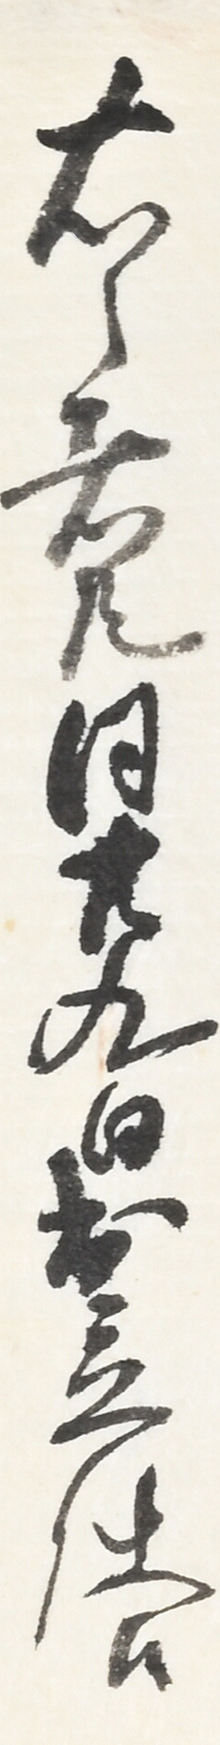右之者共同廿九日出立仕候
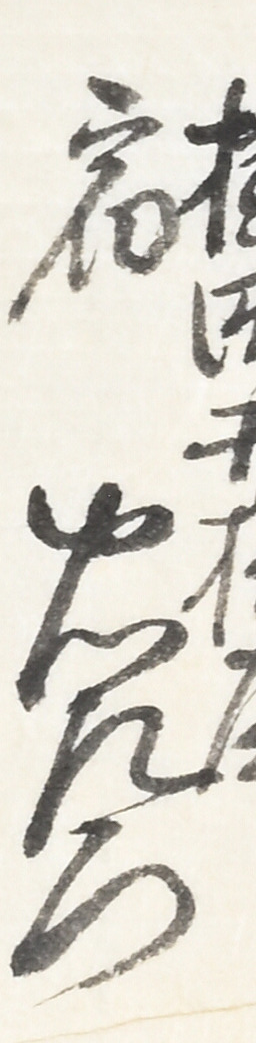宿忠左衛門
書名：旅人泊控帳
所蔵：伊那市立高遠町図書館・合同会社AMANE
